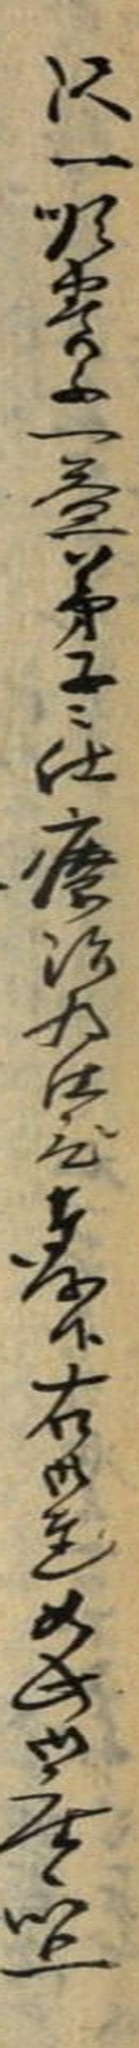沢一順養子一益弟子ニ仕療治為仕度奉存候右御達如此御座候以上
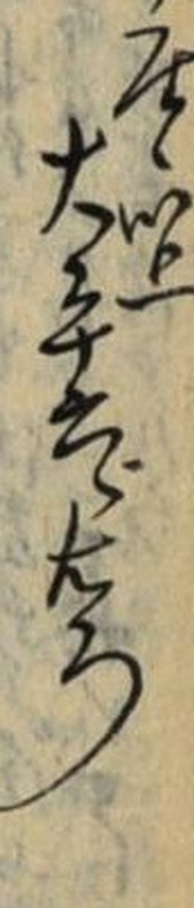様大平六郎右衛門
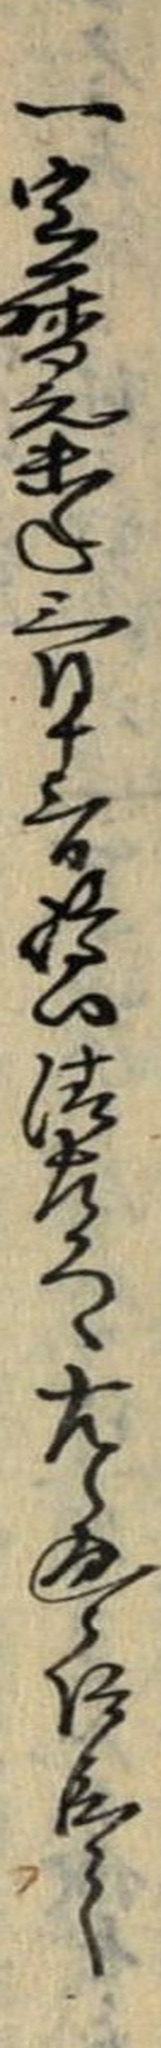一宝暦元未年三月十三日嶋田清左衛門へ左之通被仰渡之
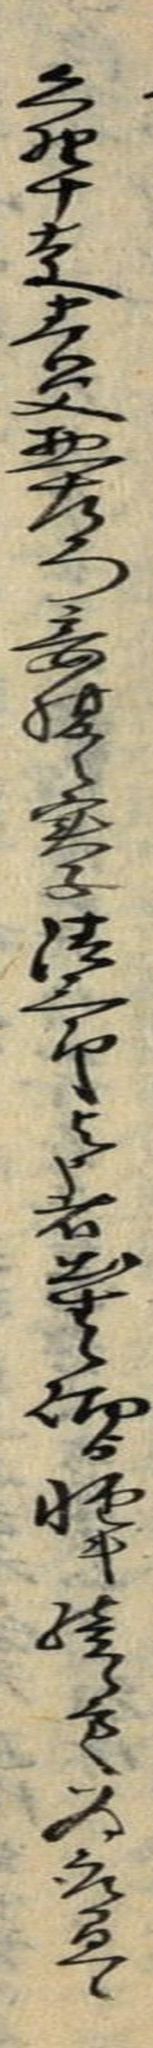久野十太夫養父惣左衛門妾腹之実子清三郎と申者出生之砌ゟ軽キ続之方へ為取置候
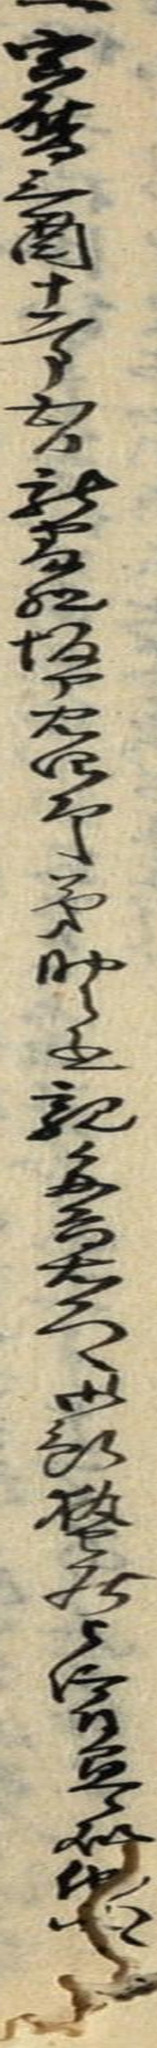一宝暦三酉十二月五日新番組坂部忠四郎弟助之丞親多曽右衛門へ御預蟄居被仰付置候処他国へ
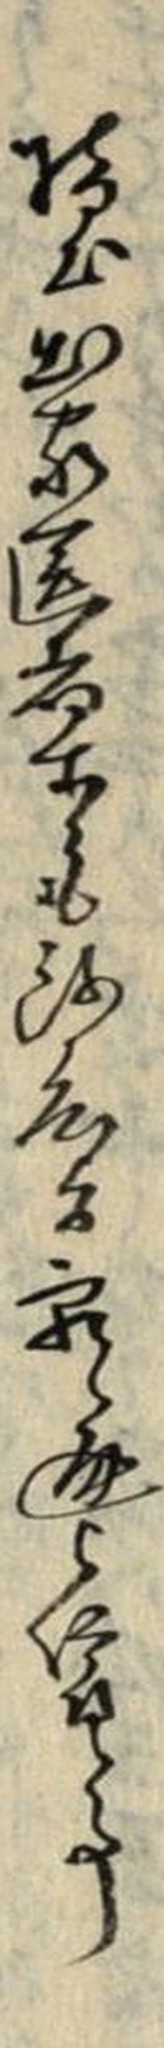指出出家医者等にも致度旨願之通被仰付候事
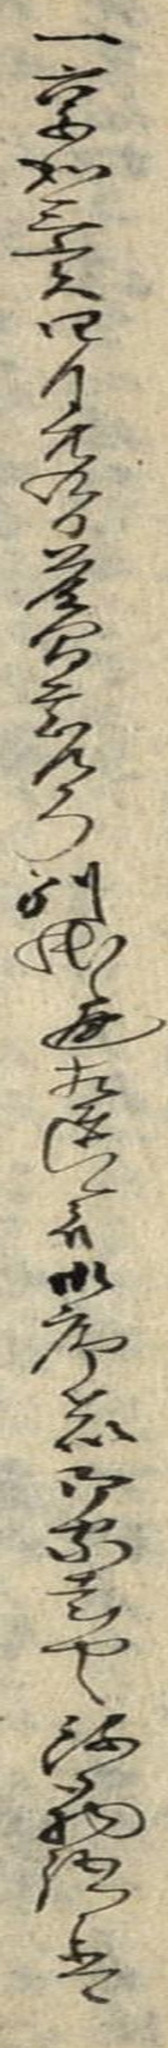一享和三亥四月廿九日藤間甚左衛門別紙之通相達候ニ付御序を以御家老中へ致御物語置候
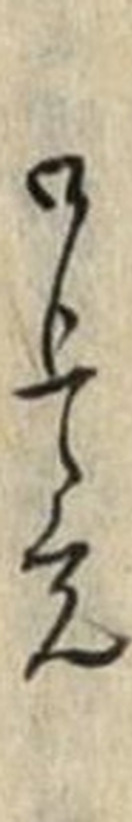口上之覚
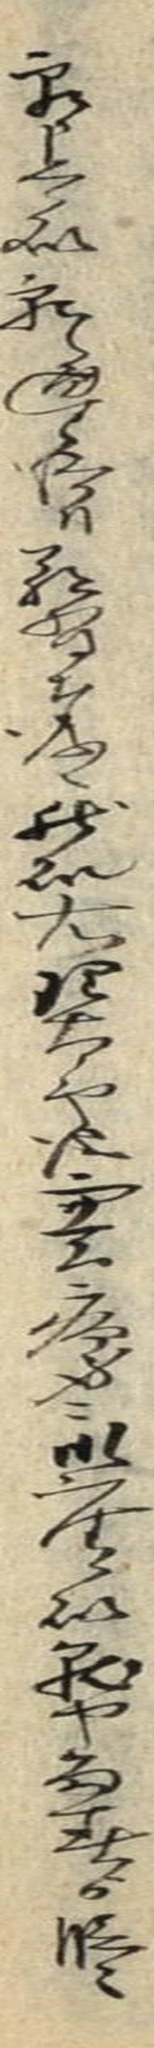願申上候処願之通被仰付難有奉存候然処右理太郎儀兼而病身ニ御座候処就中当春ゟ段々
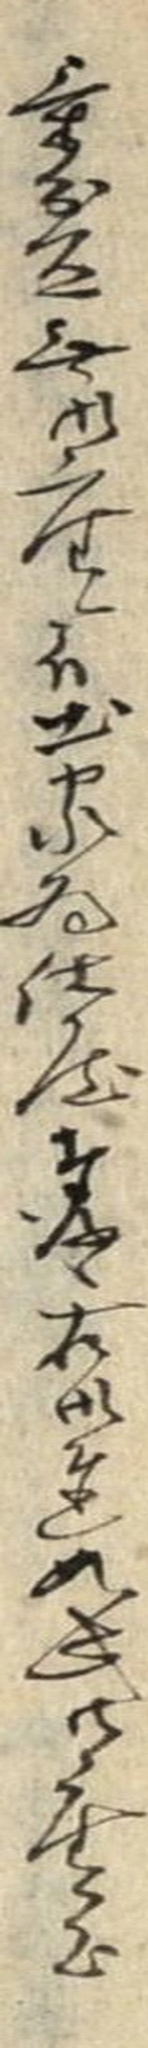気分宜無御座候ニ付出家為仕度奉存候右御達如此御座候以上
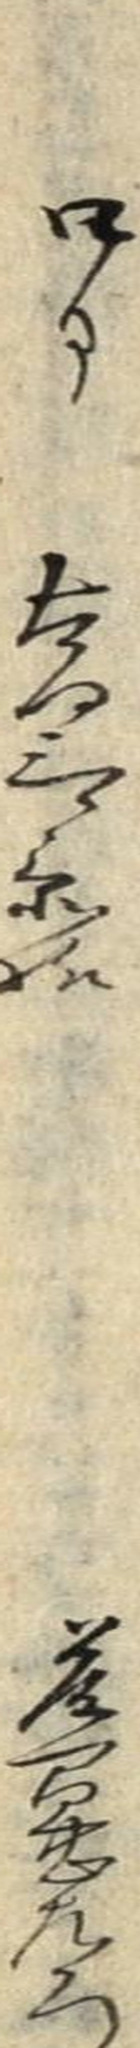四月太田三郎兵衛様藤間甚左衛門
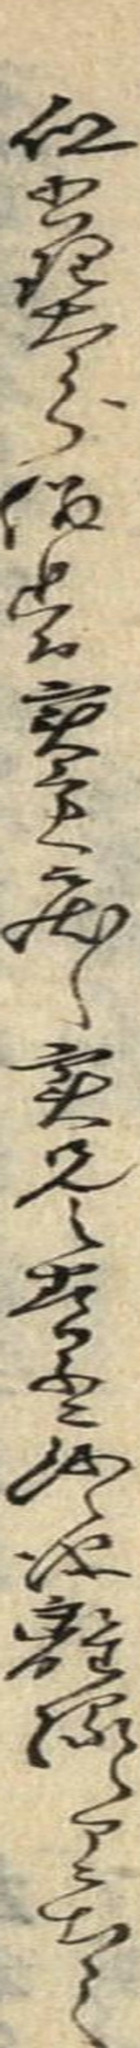但右理太郎儀追而実方へ戻し実兄之養子ニ致候儀離縁之部ニ出之
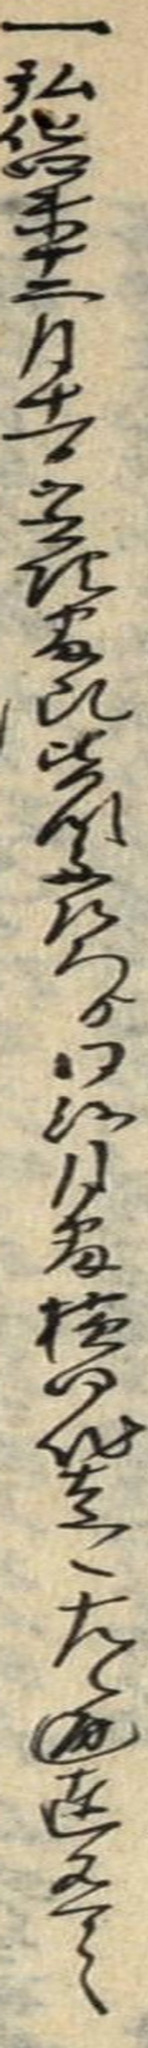一弘化四未十二月十一日御書院番頭皆川多左衛門ゟ同役月番横田作太夫ヘ左之通達有之
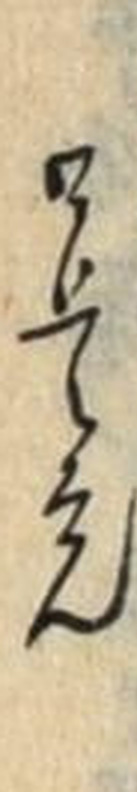口上之覚

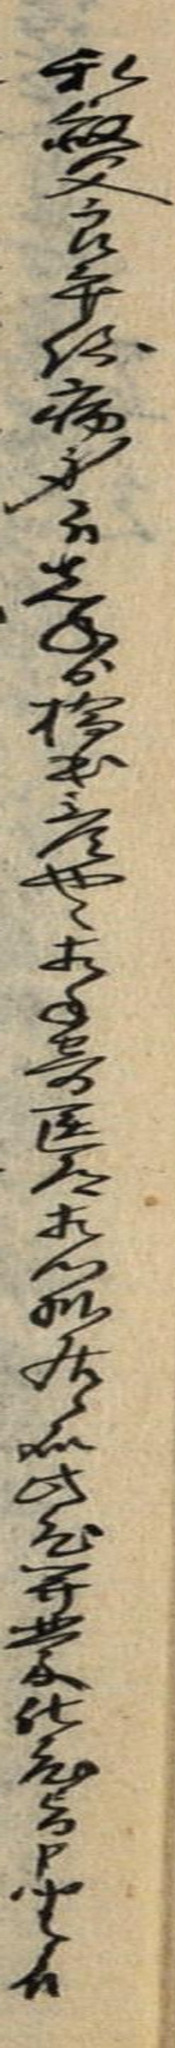私叔父良平儀病身ニ付先年ゟ橋本彦也へ相手寄医道相心掛居候処此度開業仕度旨申聞候ニ付
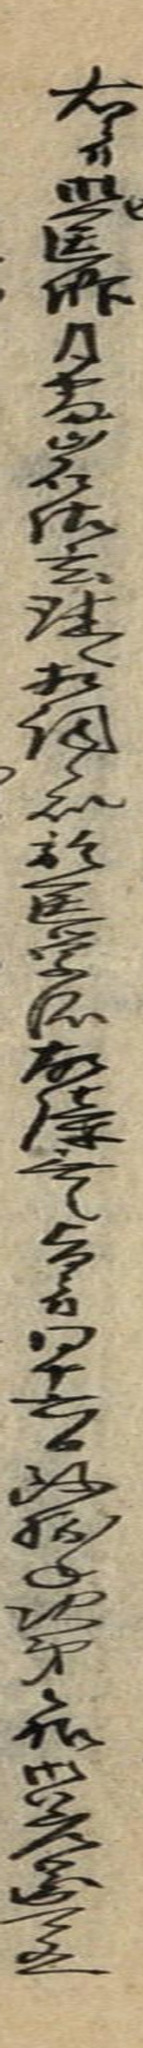右ニ付御匕医師月番岩佐玄珪ヘ相伺候処於医学所故障無之旨ニ付同十六日致勝手次第候様御差図可有
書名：養子縁組之部
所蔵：福井県文書館 Fukui Prefectural Archives
